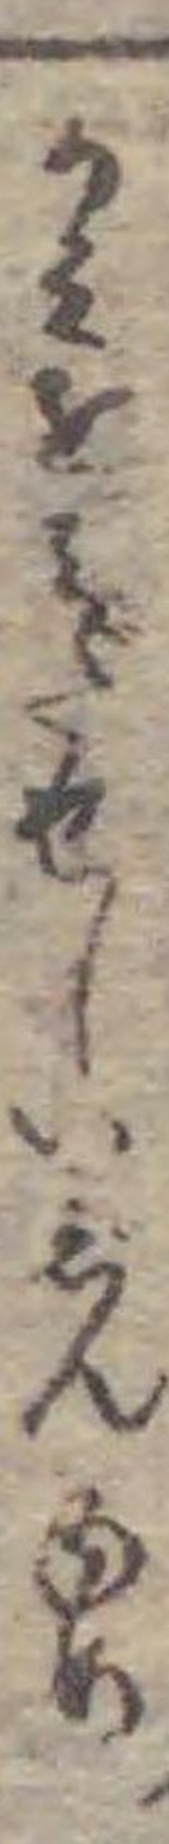かみをみだせしいじんゆめ
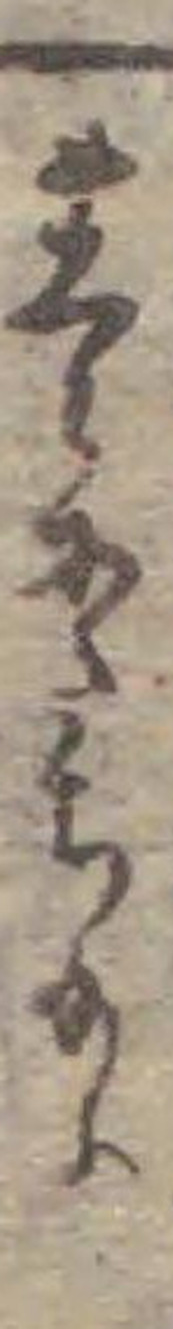まくらにたち給ふ
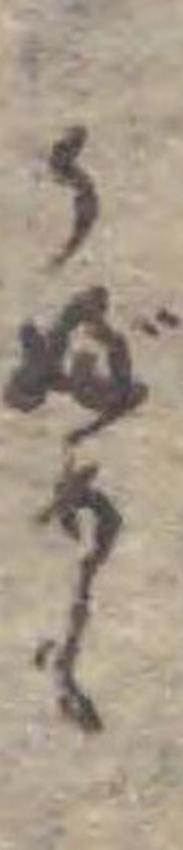うぶめも
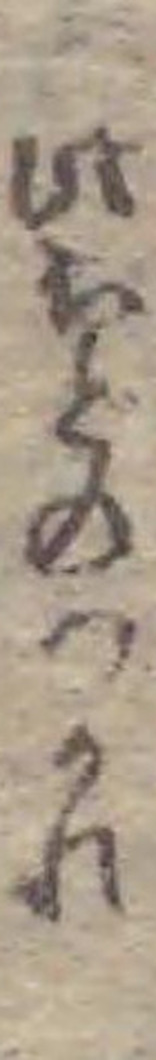此ほどのつかれ
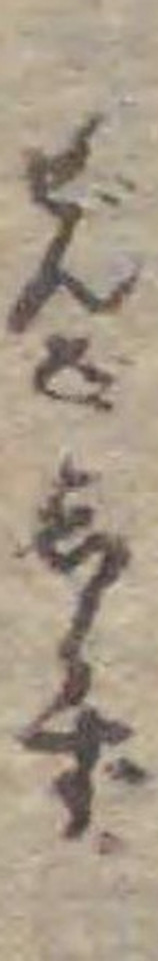ぜんごしらず
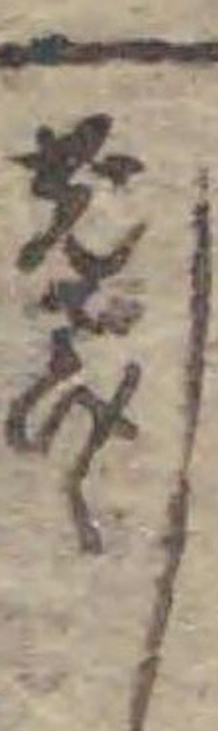ぜんざい〳〵
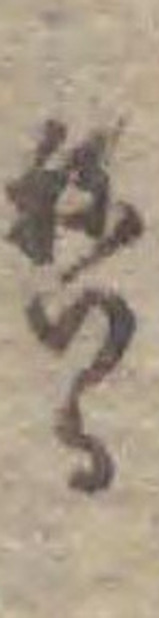ねいる
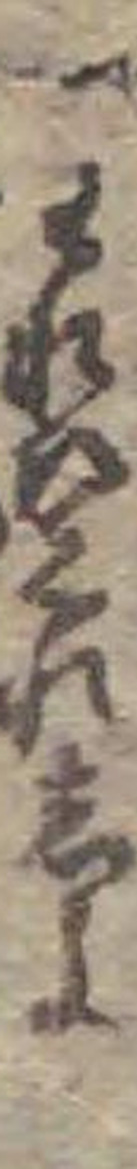われはこれしよ
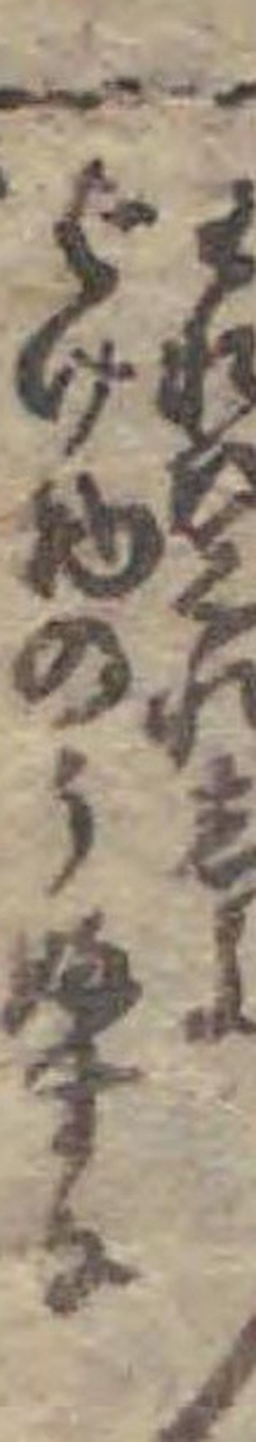ばけ物のうふすな
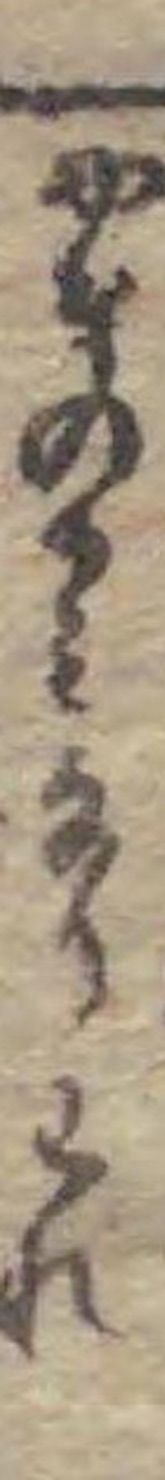やまのかみなりわれ
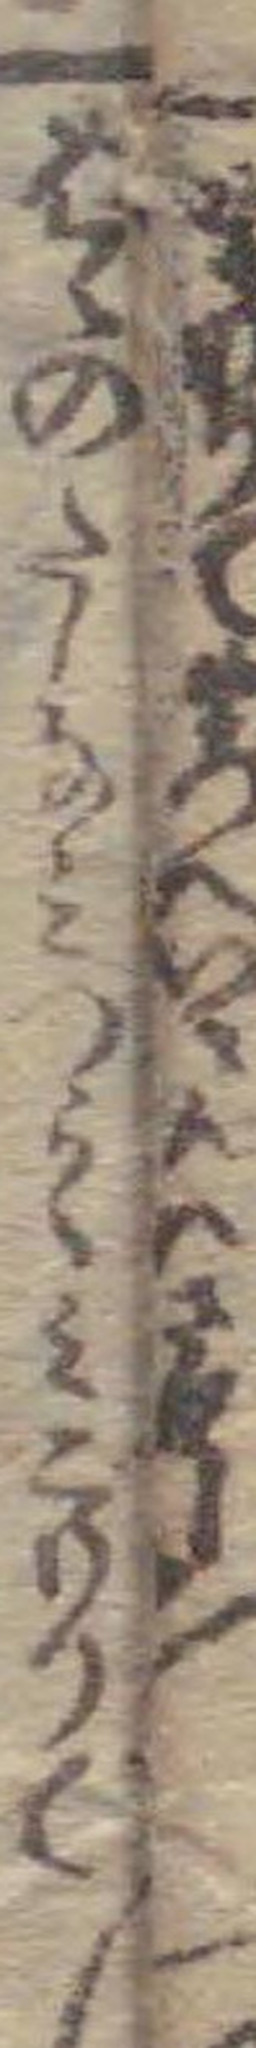はゝのたしなみつらくみこもりて
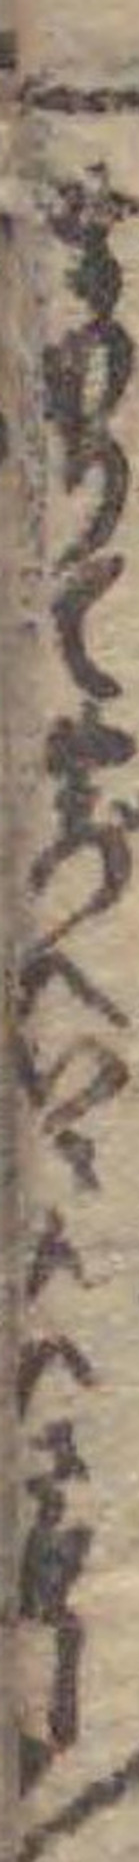まもりてまづへいんはさまし
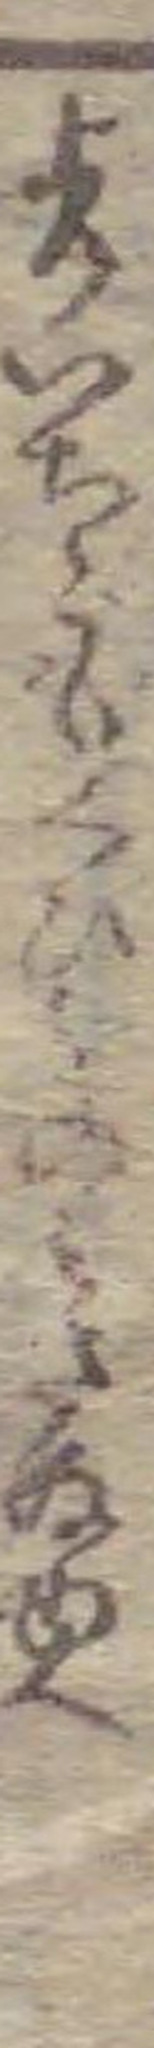よりいちどもくひをのはさぬゆへ
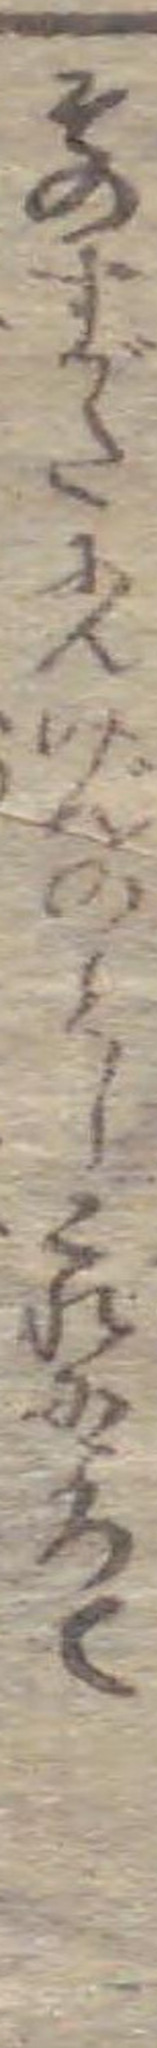そのすがたにんげんのことしこれによつて
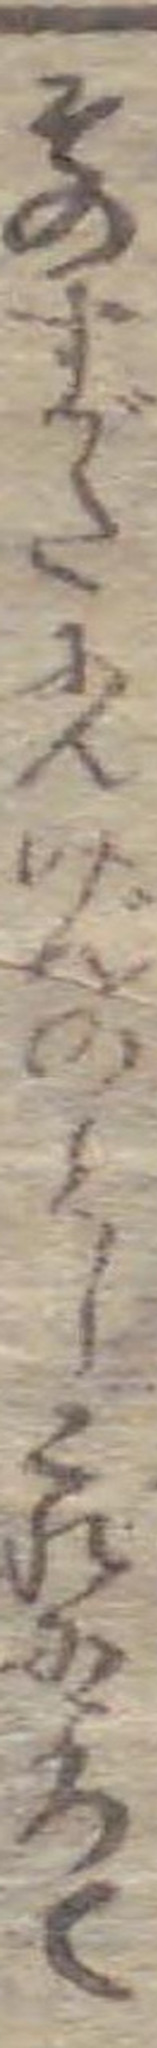そのすがたにんげんのことしこれによつて
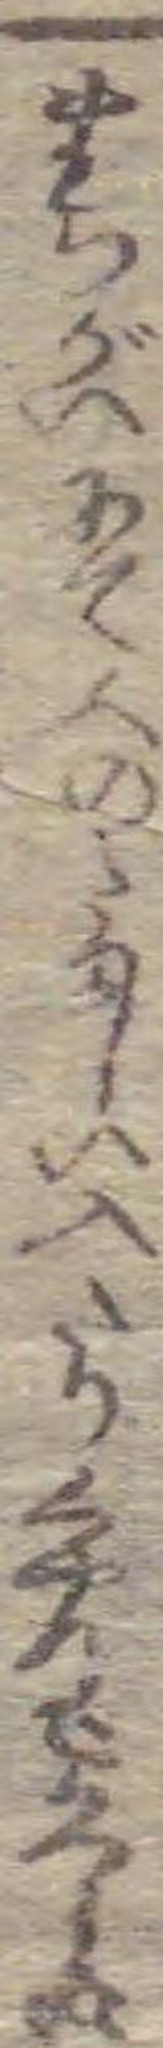まちがいにて人のたましい入たりくやんでかへらぬ
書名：[化物一代記] : 5巻
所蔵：国立国会図書館 National Diet Library, JAPAN
